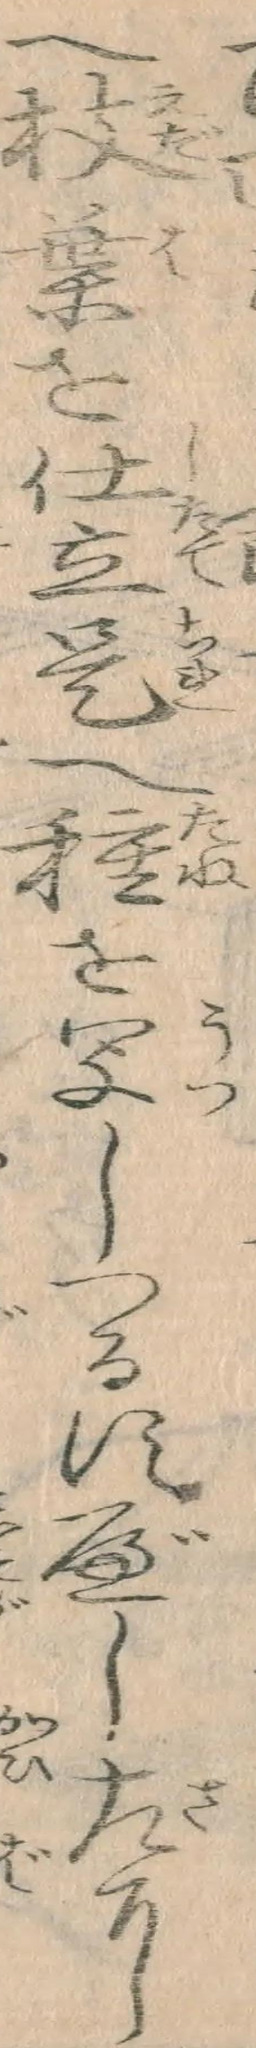へ枝葉を仕立是へ種を写しつるすべし左に
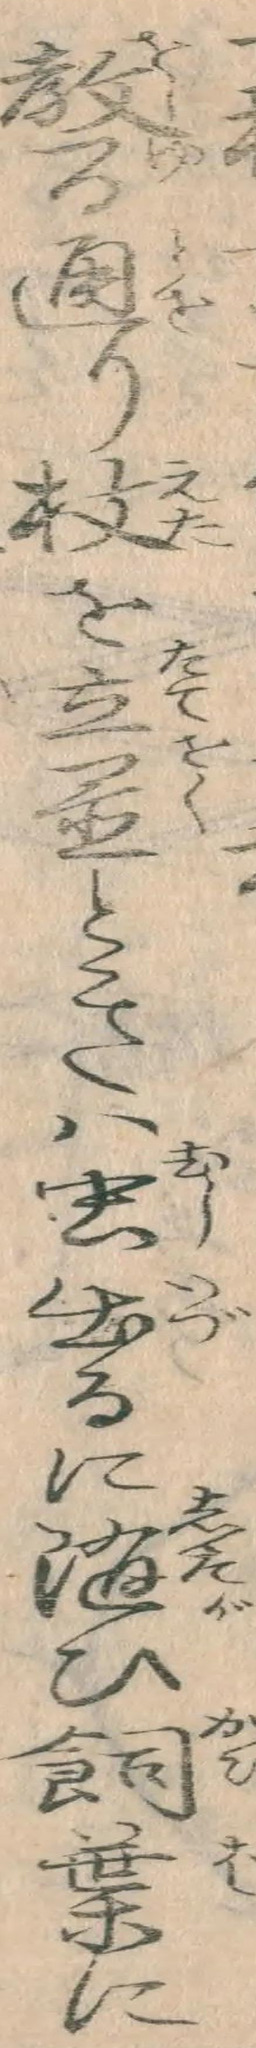教る通り枝を立置ときは虫出るに随ひ飼葉に
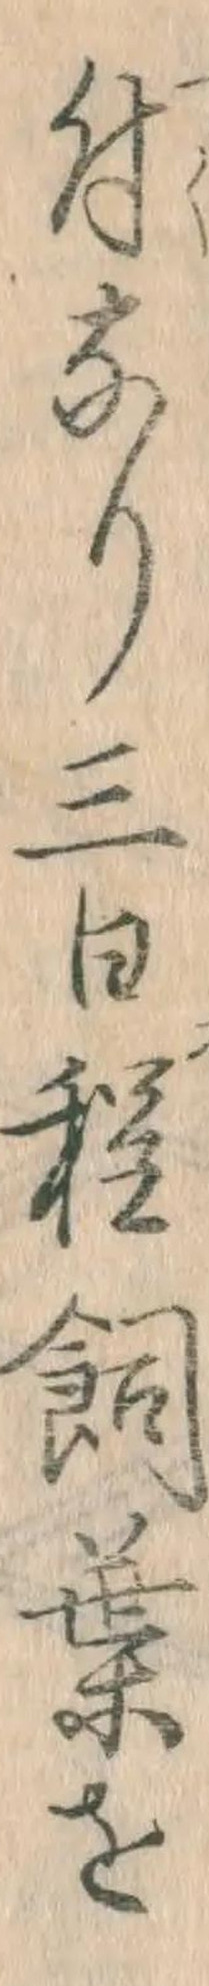付なり三日程飼葉を

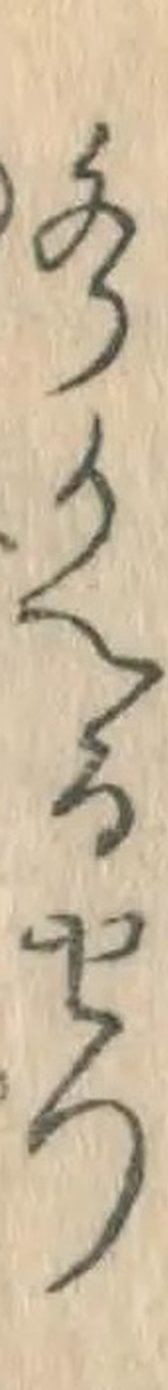水かへるせつ
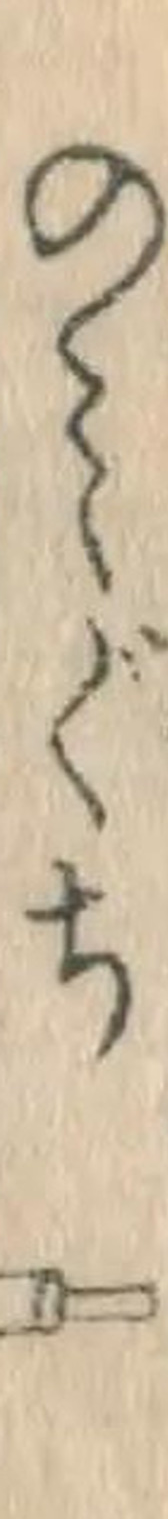のみぐち
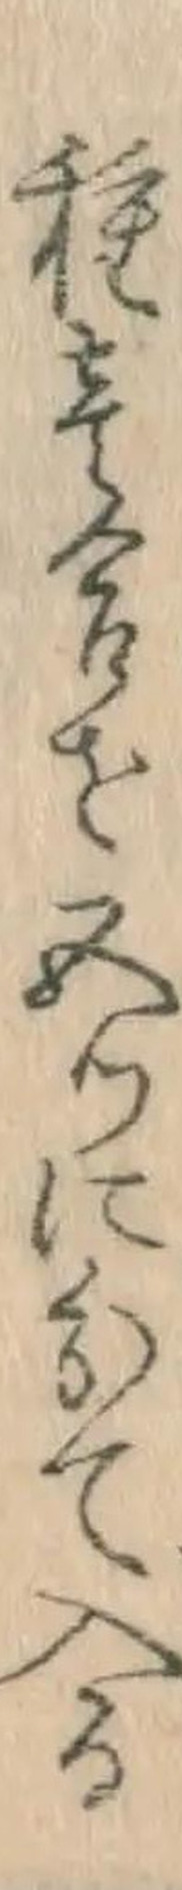種壱合を五ツに分て入る
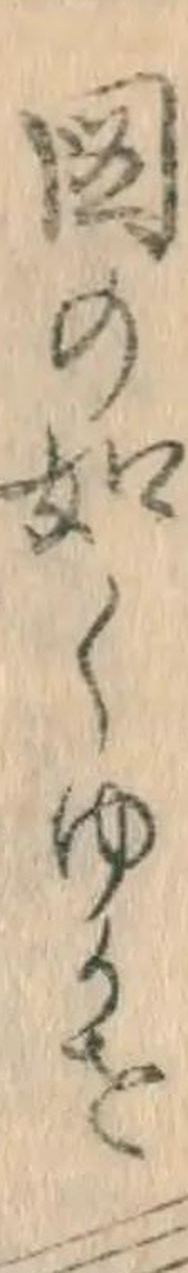図の如くゆかを
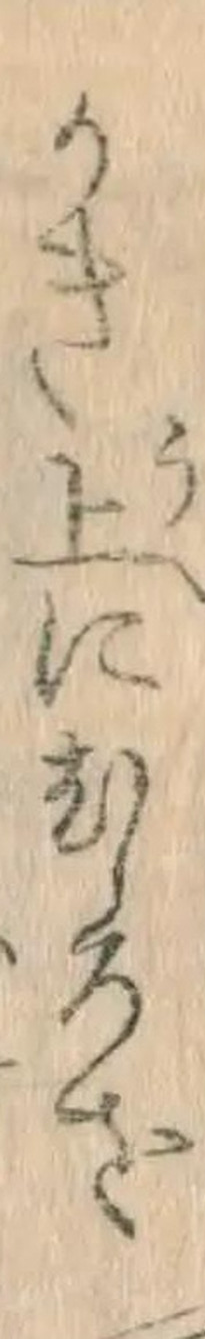かき上にむしろを
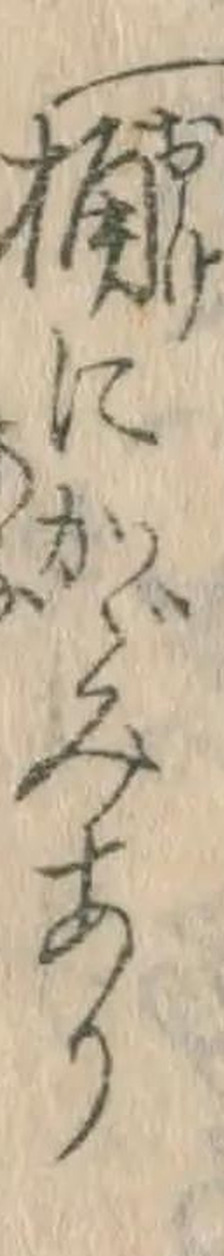桶にかゞみあり
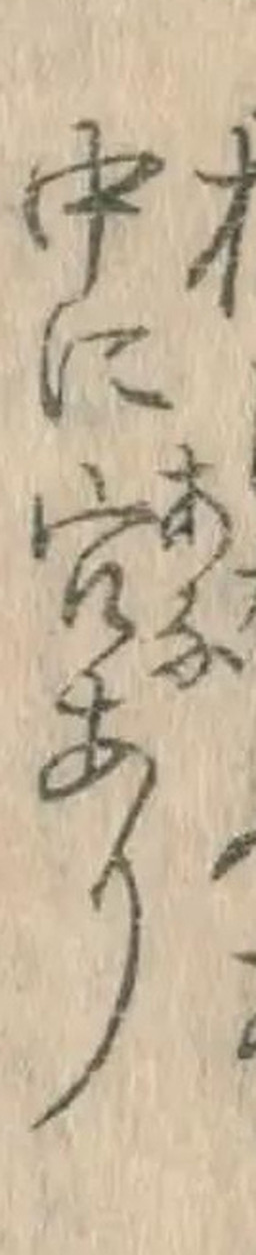中に穴あり
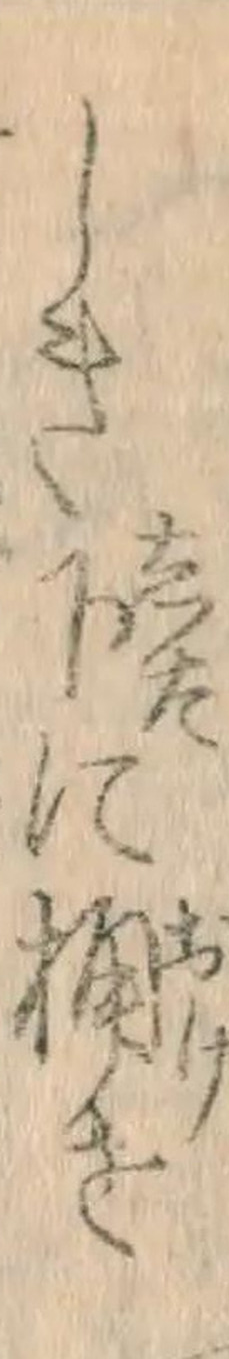しき下に桶を
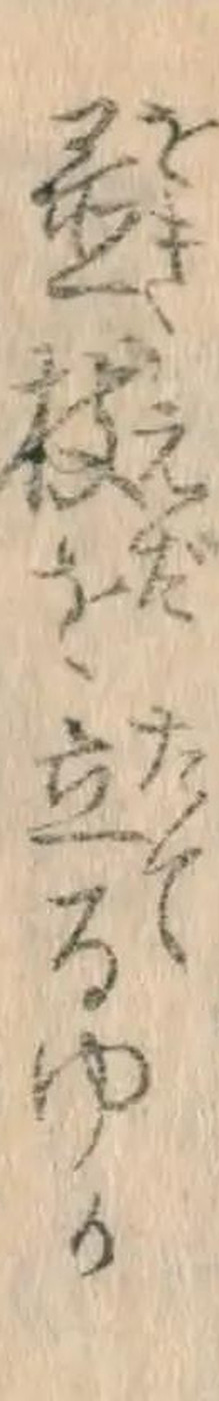置枝を立るゆか
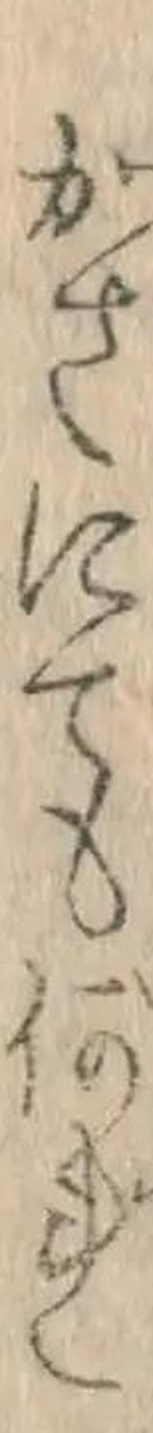かさにても何連れ
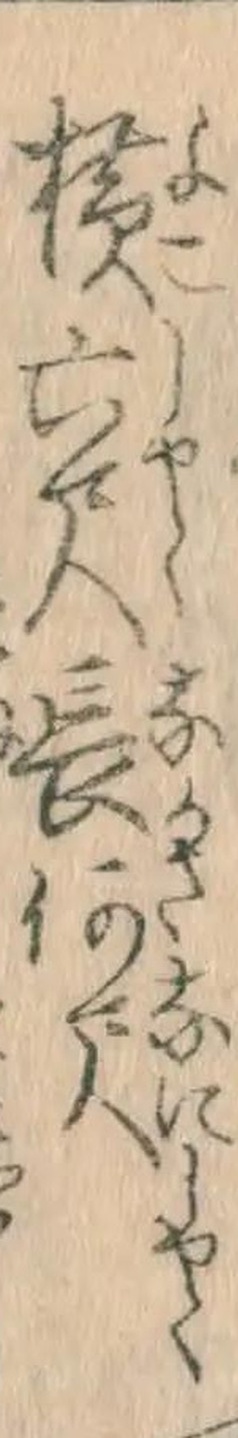横六尺長何尺
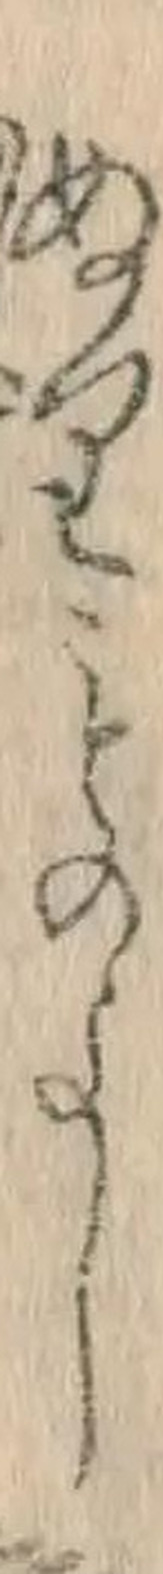ぬりものよし
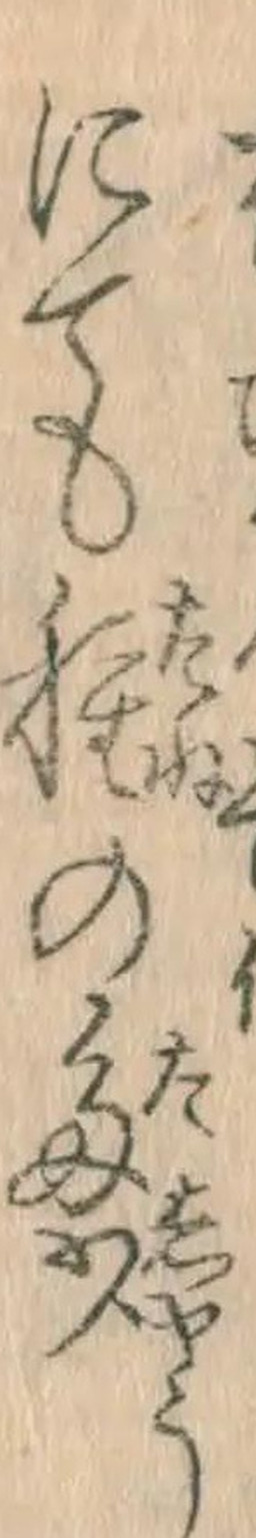にても種の多少
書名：山繭養法秘傳抄
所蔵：国立国会図書館 National Diet Library, JAPAN
